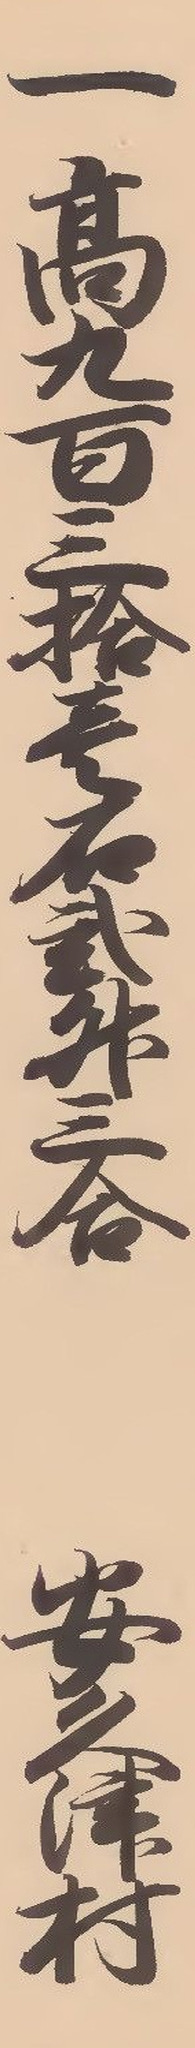一高九百三拾壱石弐升三合安久津村
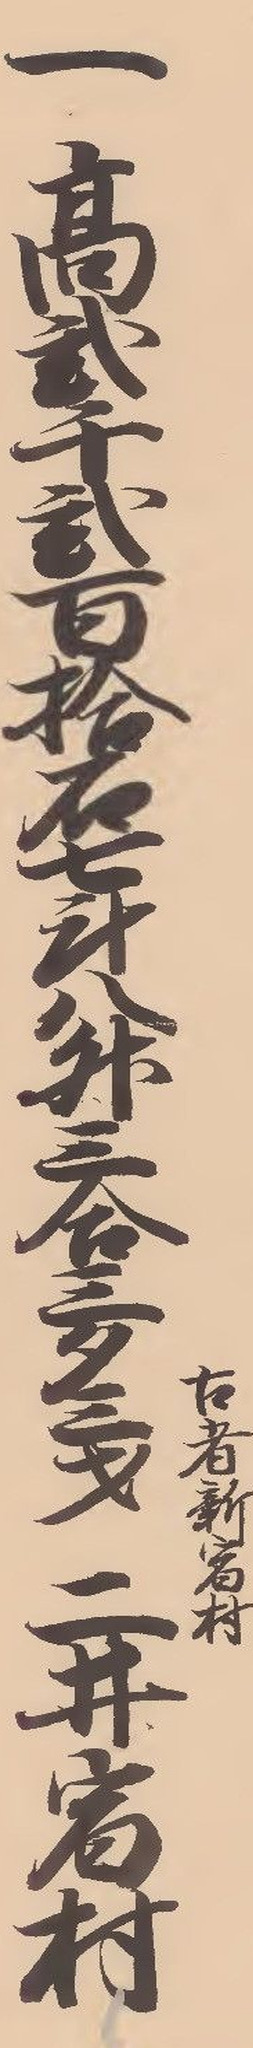一高弐千弐百拾石七斗八升三合三勺三才二井宿村

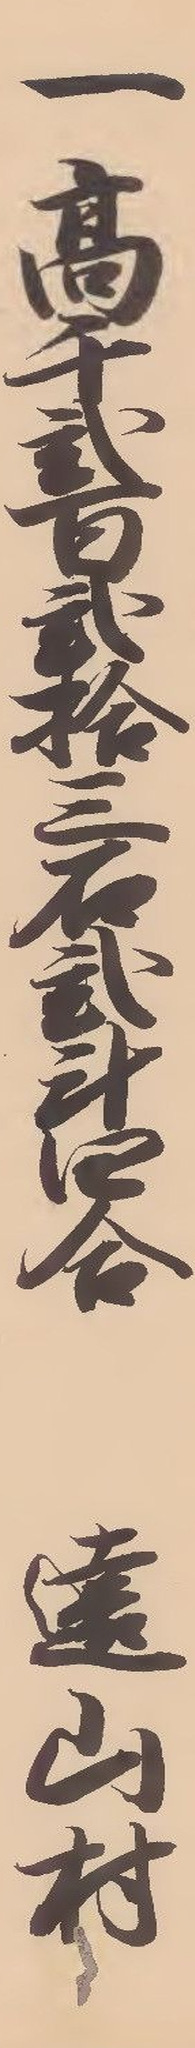一高千弐百弐拾三石弐斗四合遠山村
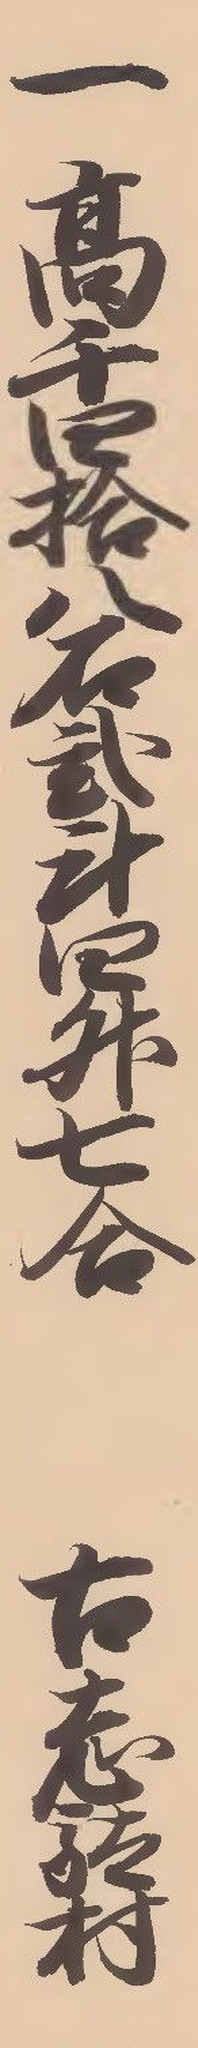一高千四拾八石弐斗四升七合古志駄村
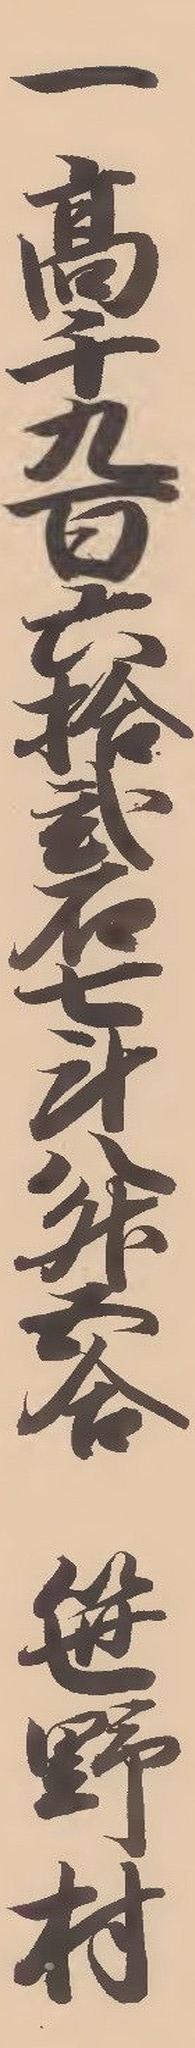一高千九百六拾弐石七斗八升五合笹野村
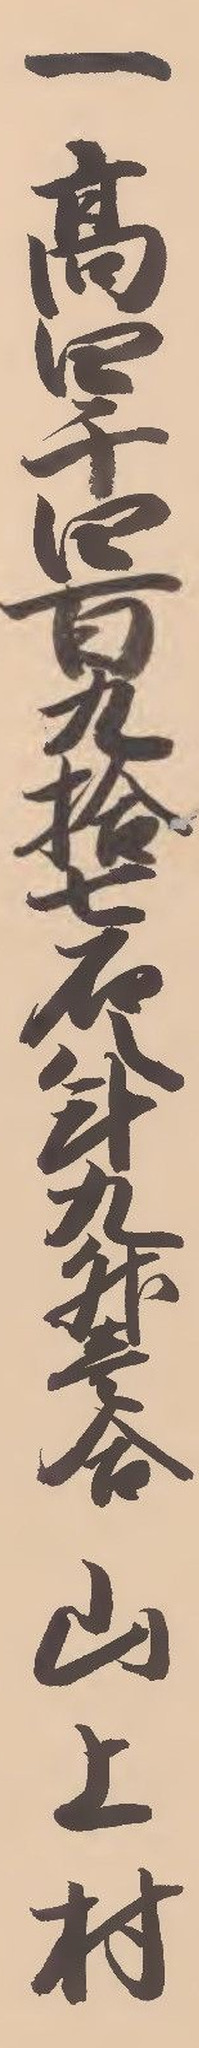一高四千四百九拾七石八斗九升壱合山上村
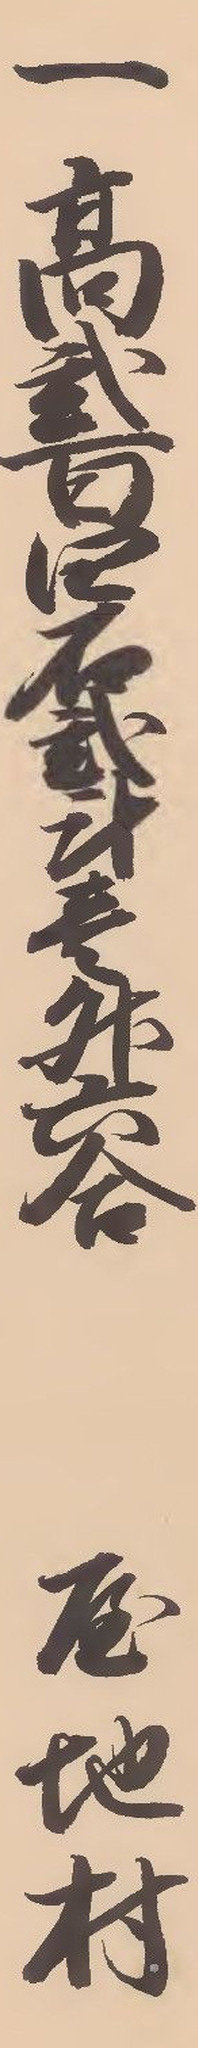一高弐百四石弐斗壱升六合屋地村
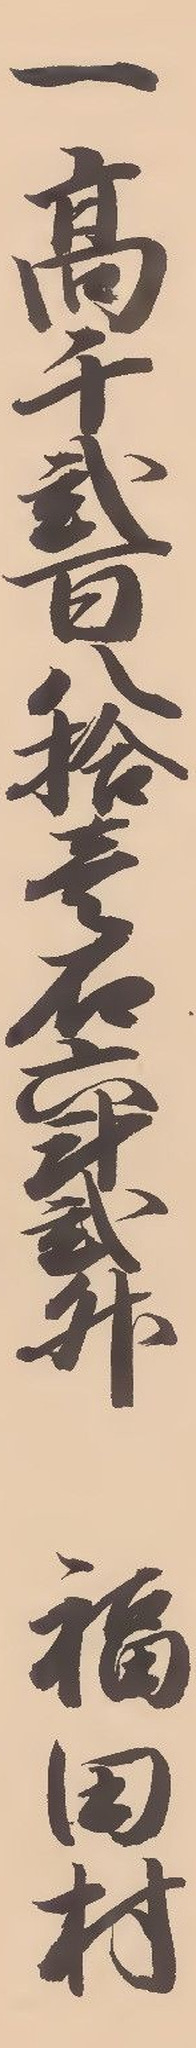一高千弐百八拾壱石六斗弐升福田村
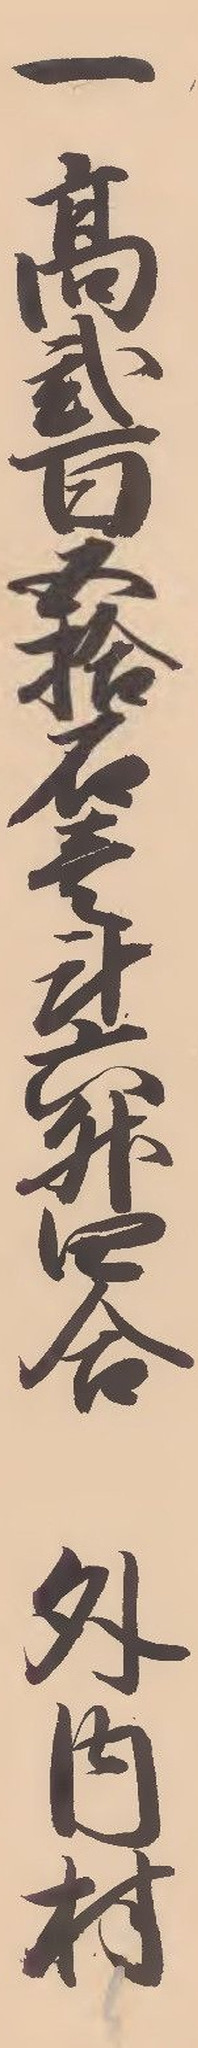一高弐百五拾石壱斗六升四合外内村

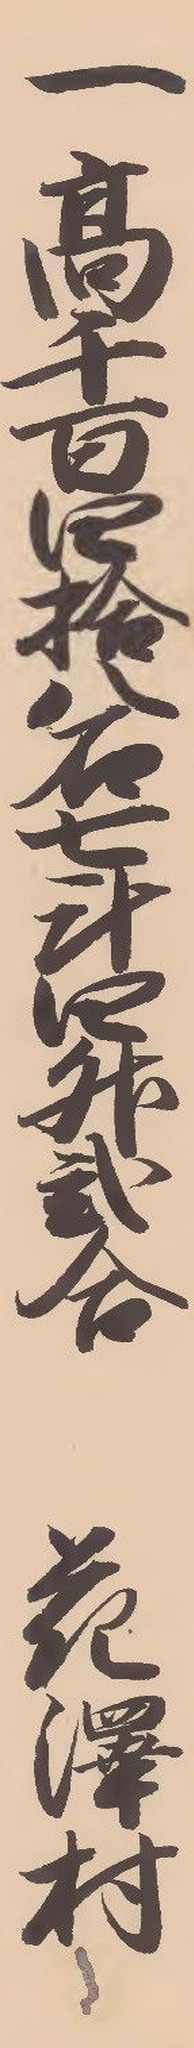一高千百四拾八石七斗四升弐合花沢村
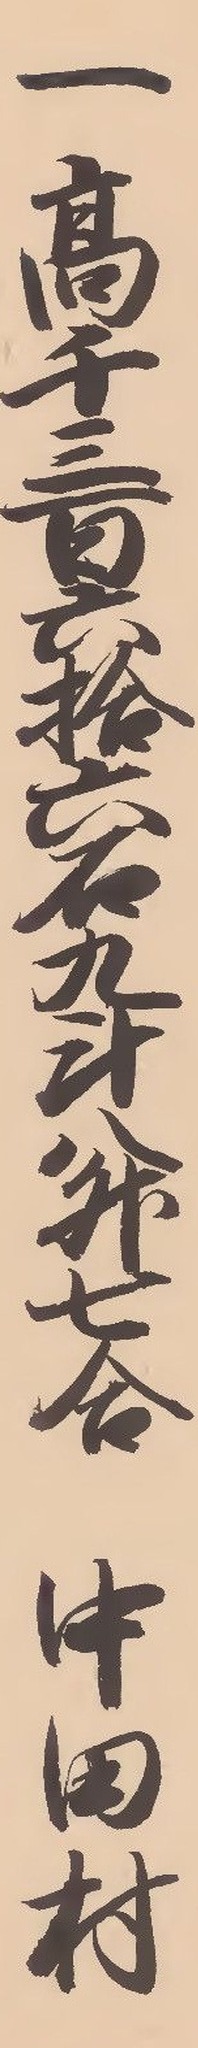一高千三百六拾六石九斗八升七合中田村
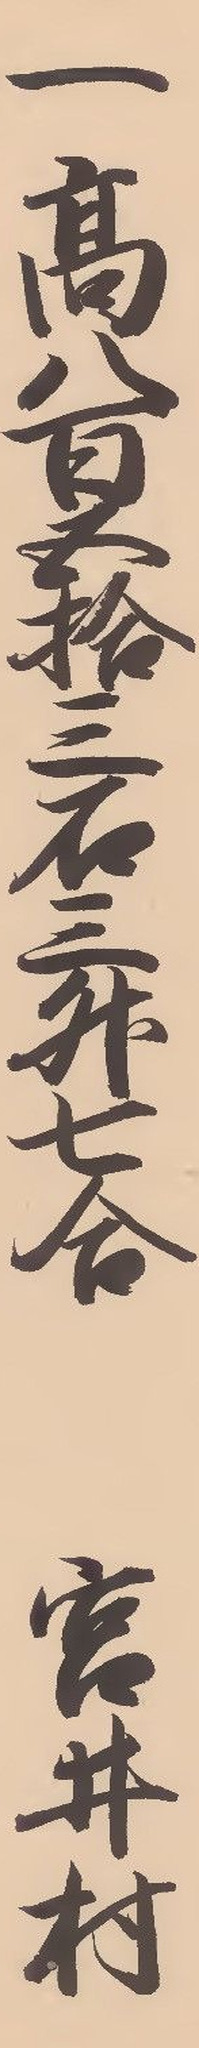一高八百五拾三石三升七合宮井村
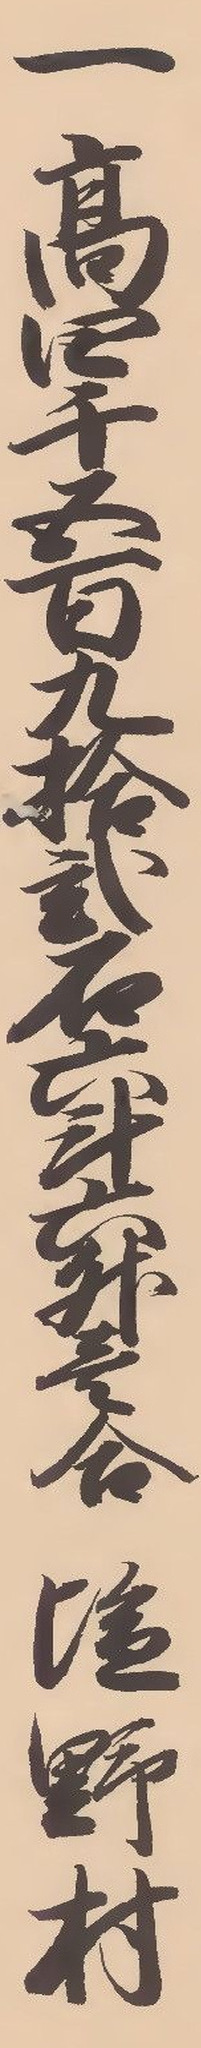一高四千五百九拾弐石六斗六升壱合塩野村
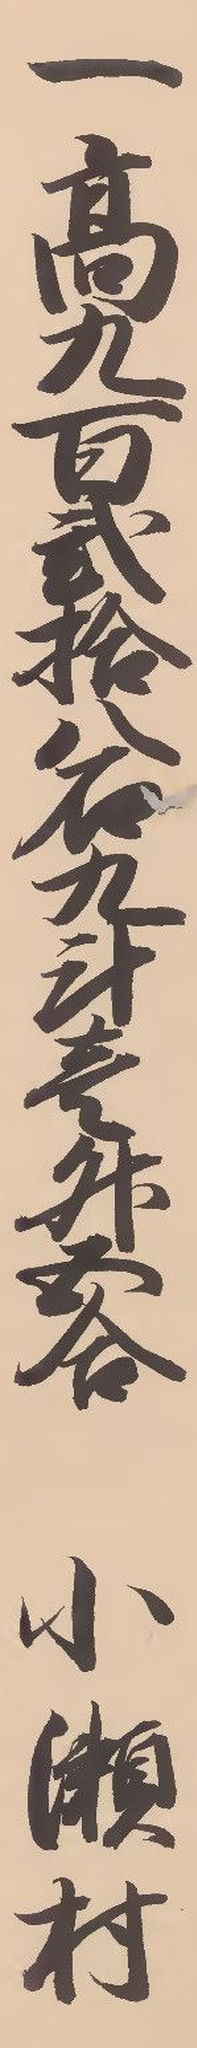一高九百弐拾八石九斗壱升五合小瀬村
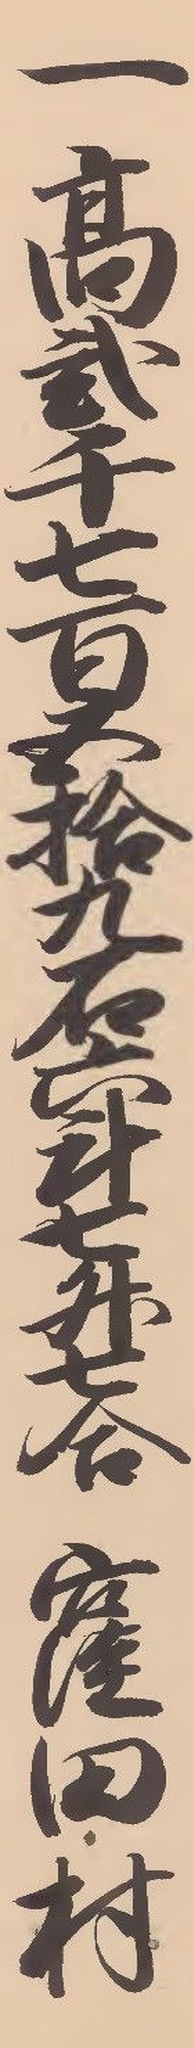一高弐千七百五拾九石六斗七升七合窪田村
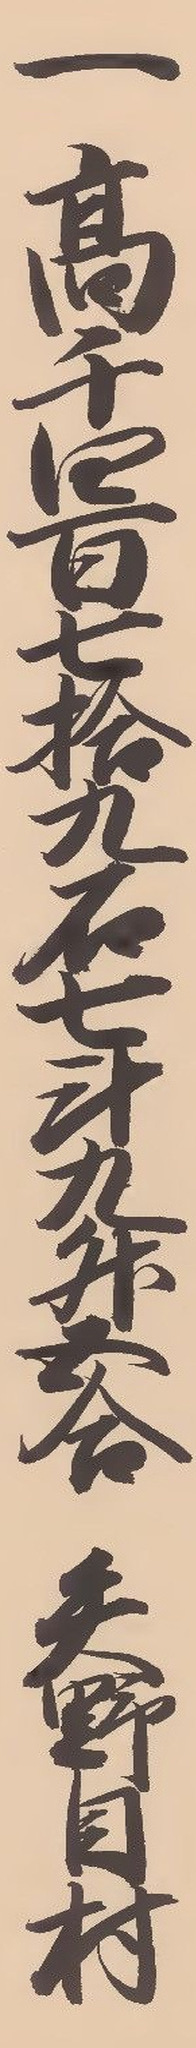一高千四百七拾九石七斗九升五合矢野目村
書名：出羽国郷帳　１
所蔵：国立公文書館 National Archives of Japan
